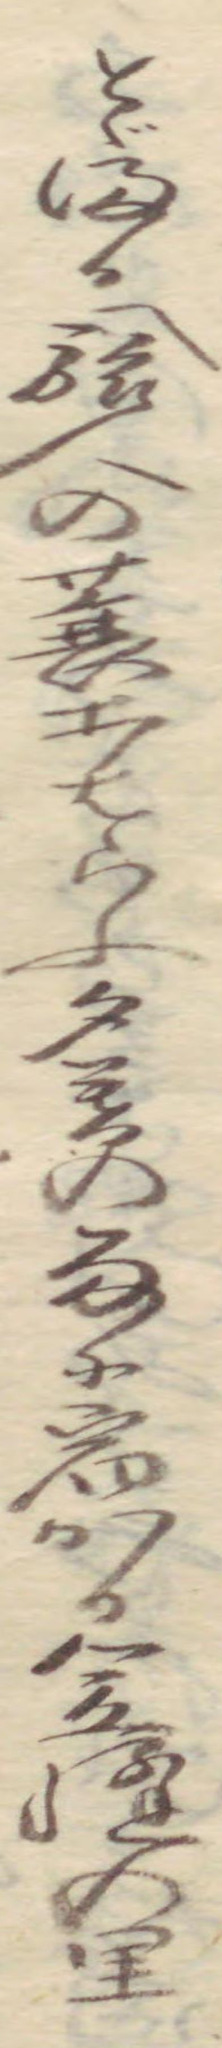とゞまる〽旅人の蓑打はらふ夕暮の雨に宿かる笠縫の里
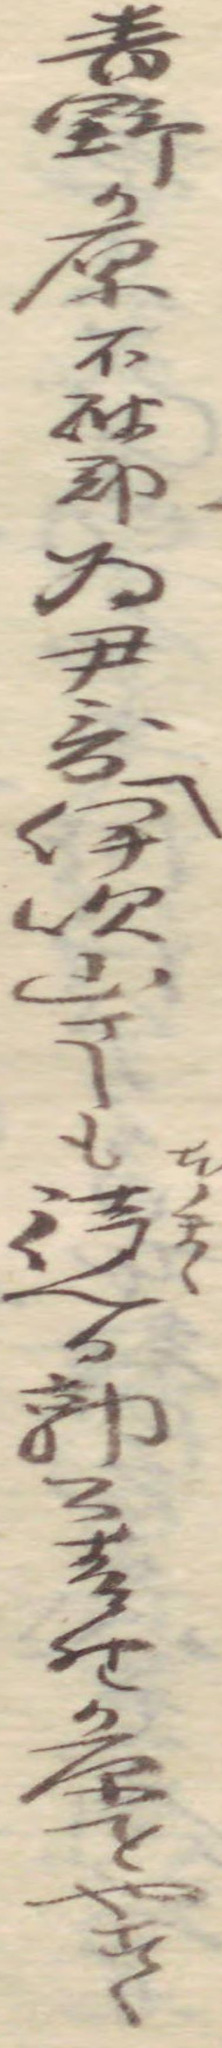青野か原不破郡為尹歌〽伊吹山さしも待へる郭公青野か原をやすく
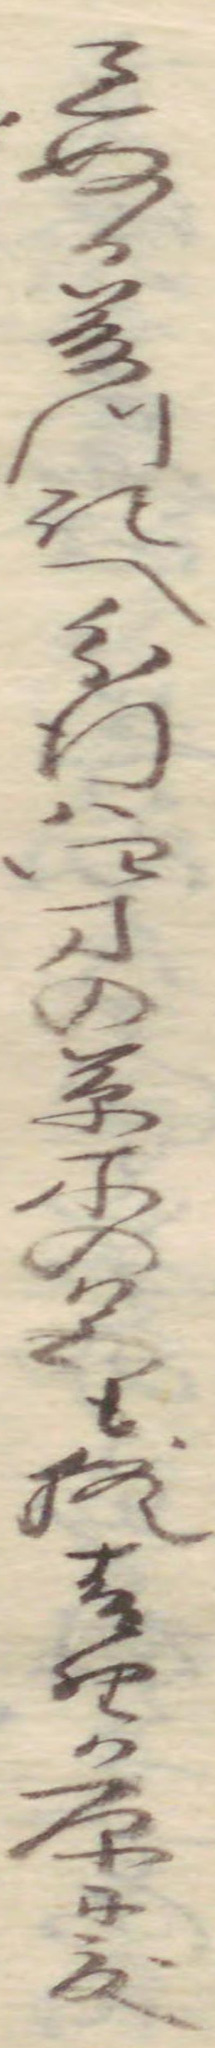過ぬる藤川記〽分行は四方の草木の色も猶青野か原に夏
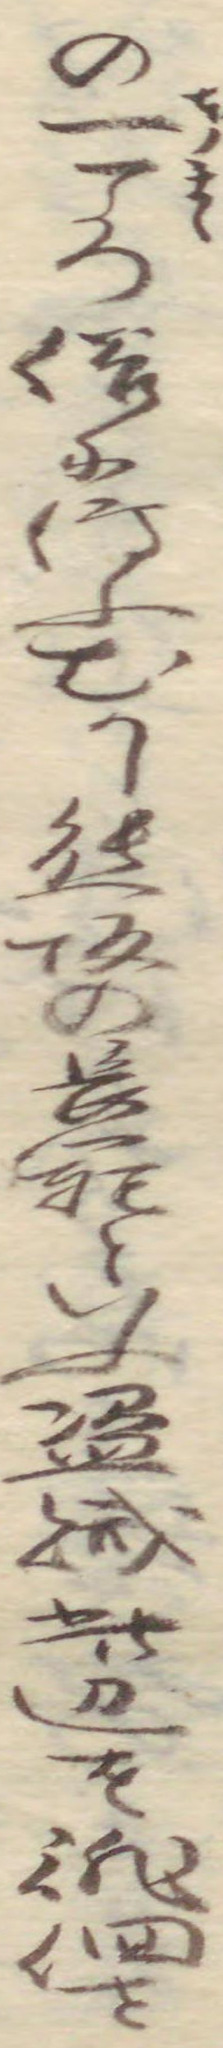の一ころ俗に伝ふむかし熊坂の長範といふ盗賊此辺を徘佪せ
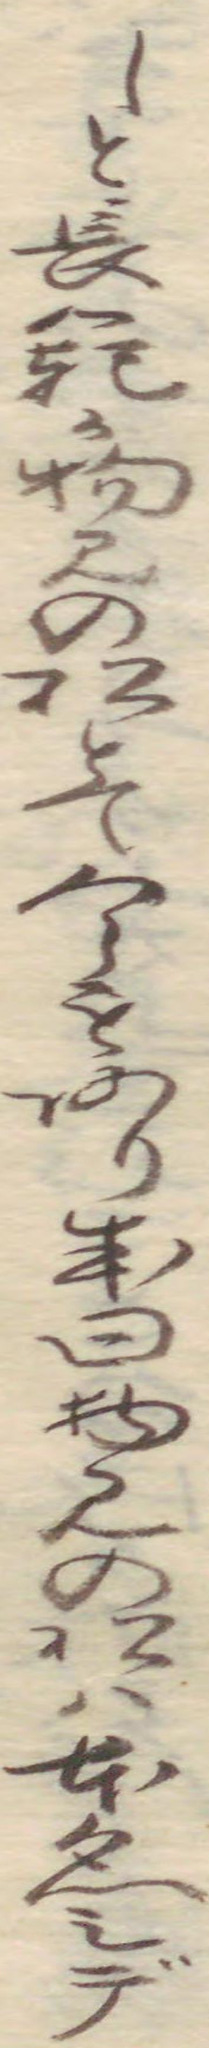しと長範か物見の松とて今もあり或曰物見の松は本名シデ
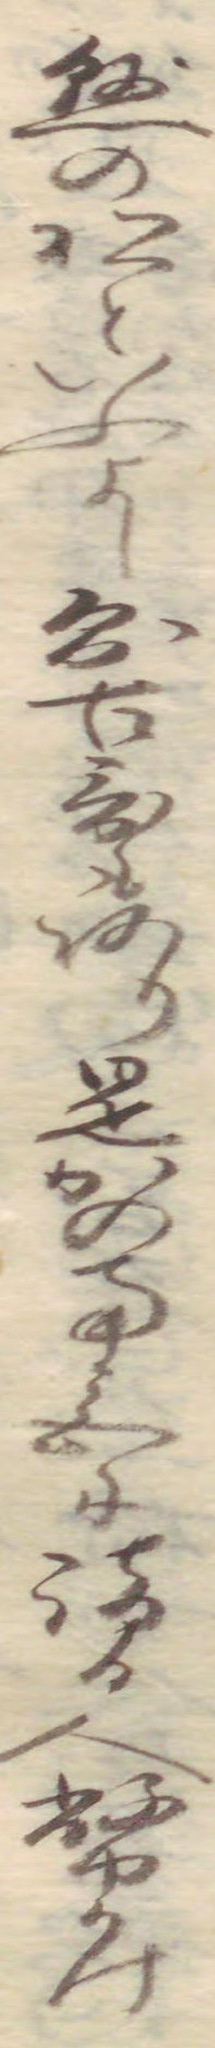懸の松といふよし則古歌もあり是かの南宮に詣る人幣かけ
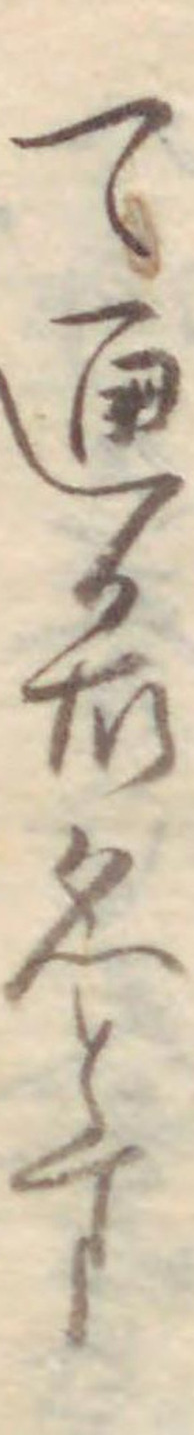て通る故名とす
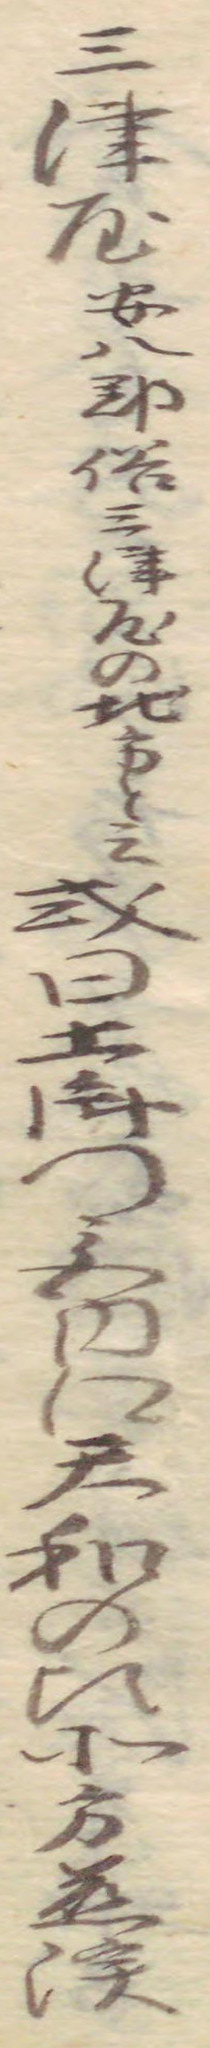三津屋安八郡俗三津屋の北方と云或曰土御門宮内卿天和の頃北方慈渓
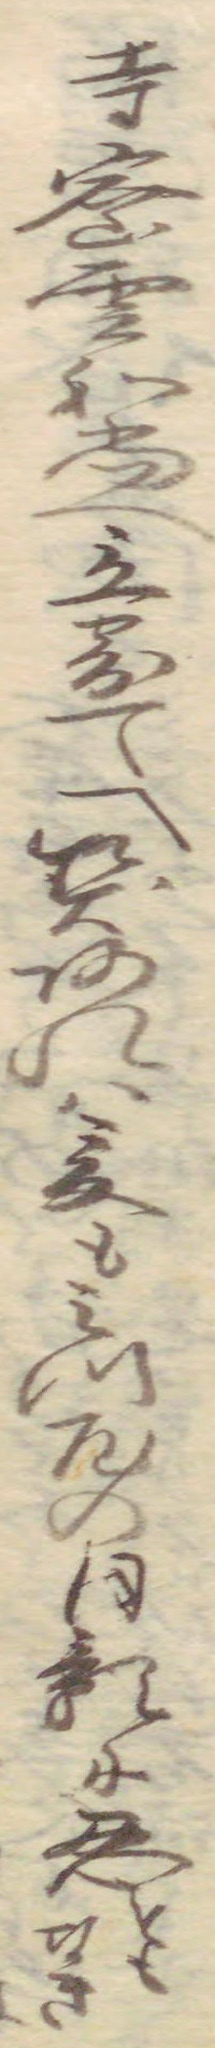寺密雲和尚へ立寄て〽契あれは爰もみつ屋の月影に忍ともなき

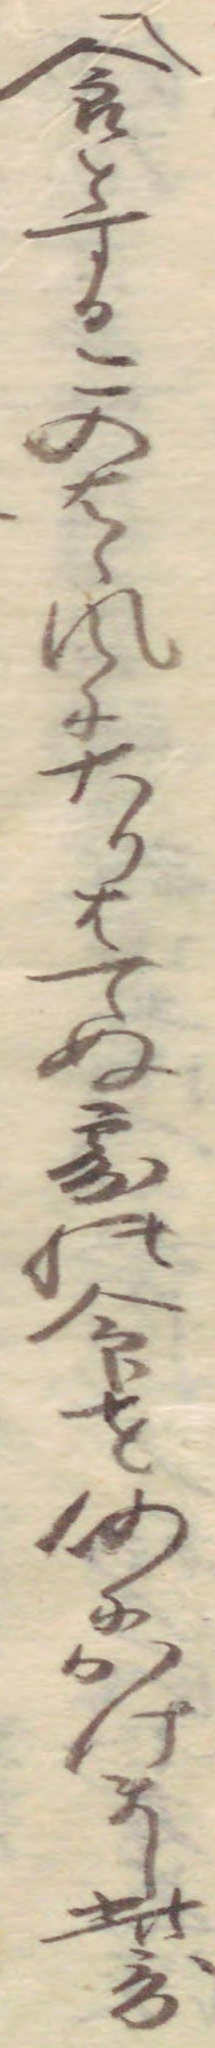〽食とするこのはゝ風にちりはてぬ露の命を何にかけまし此歌
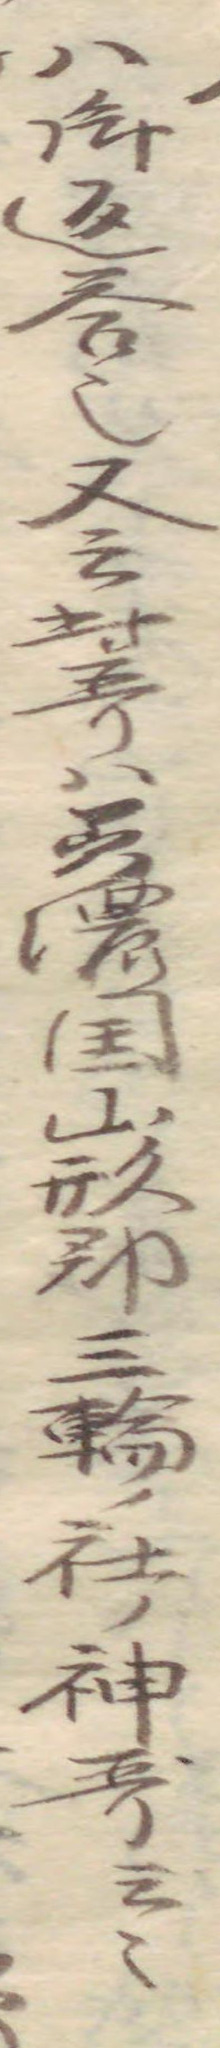は御返答也又云此歌は美濃国山形郡三輪ノ社ノ神歌云〻
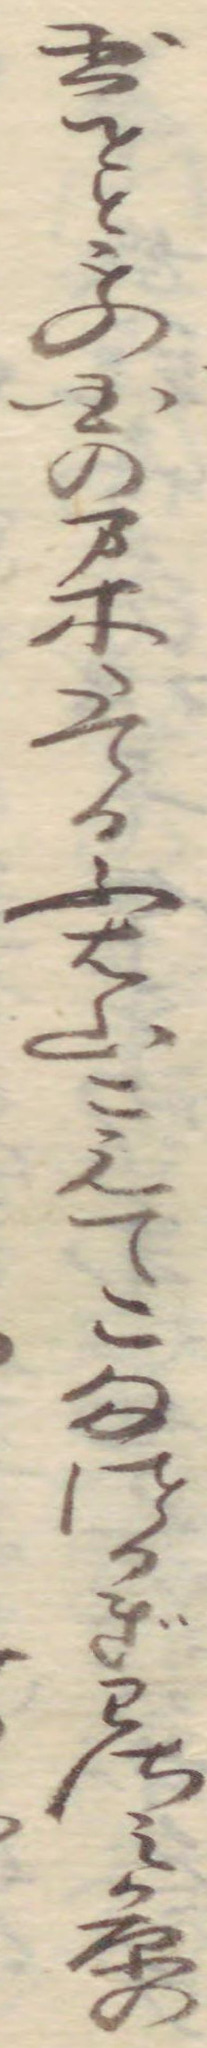書そともの国万木たてるふは山こえてこまつるぎわさみか原の
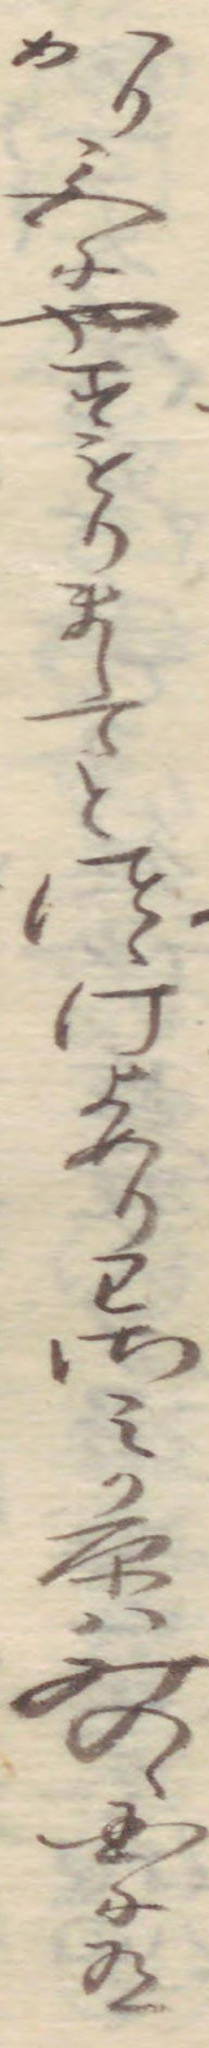かり宮にやすもりましてとつゝけよめりわさみか原はみのゝ国に有
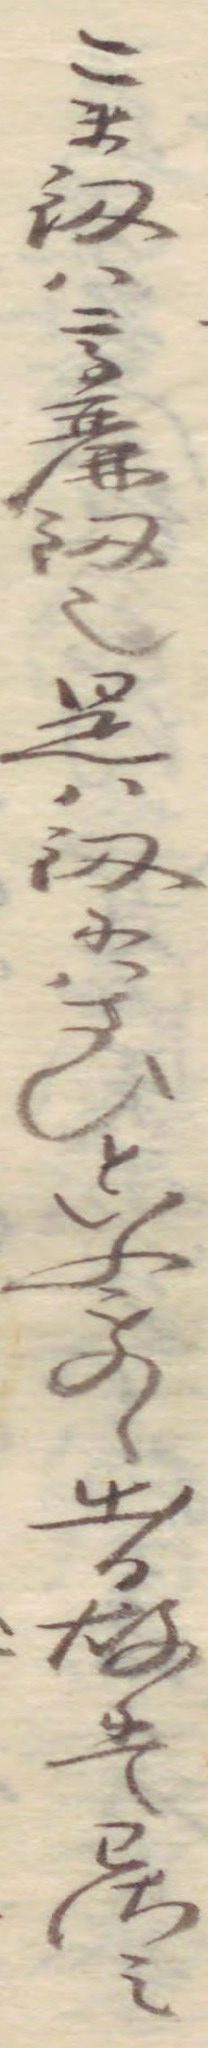こま釼は高麗釼也是は釼にはさひといふものゝ出る故にてわさみ
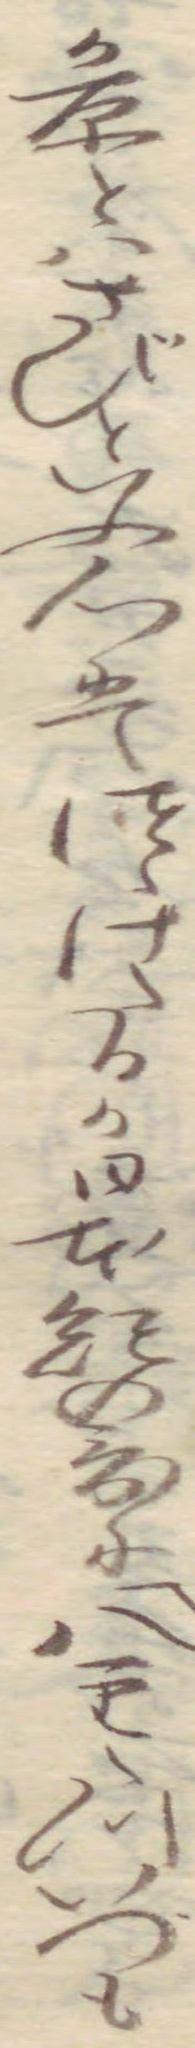か原とはさびといふ心にてつゝけたるか日本記の歌に〽八雲たついづも
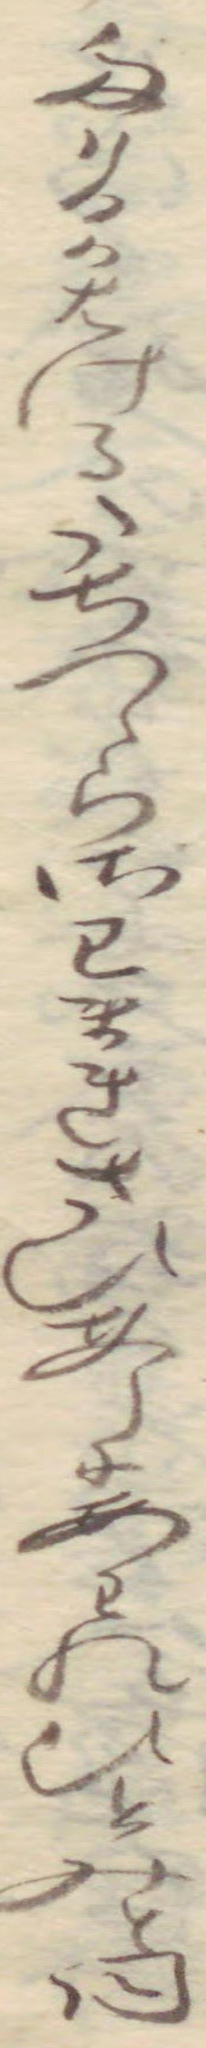たけるかはけるたちつゝらさわまきさひなしにあわれひとみと同
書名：鶯宿雑記. 巻263-264
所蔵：国立国会図書館 National Diet Library, JAPAN
